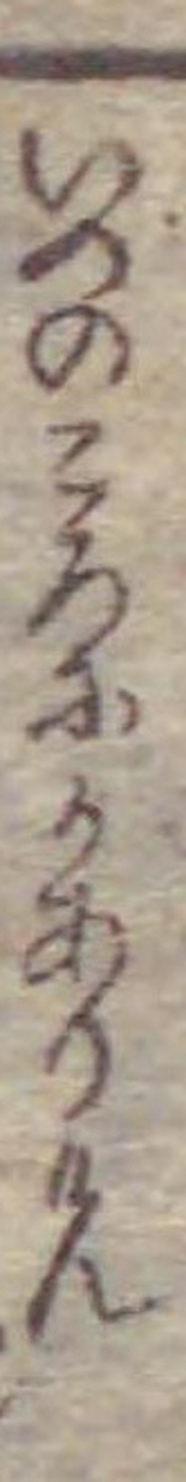いつのころにかありけん
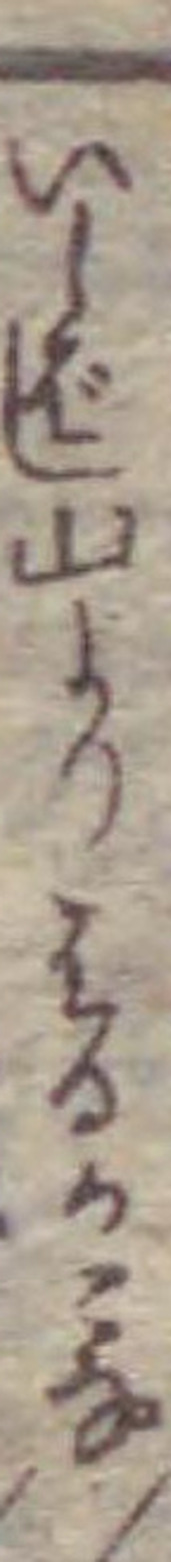いしばし山よりはるかこな
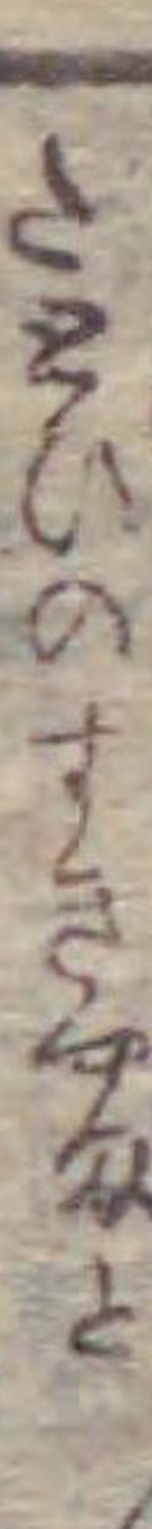たとひのすきやまと
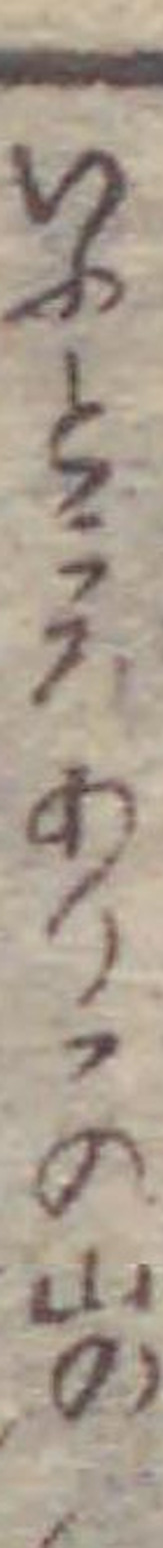いふところありこの山の
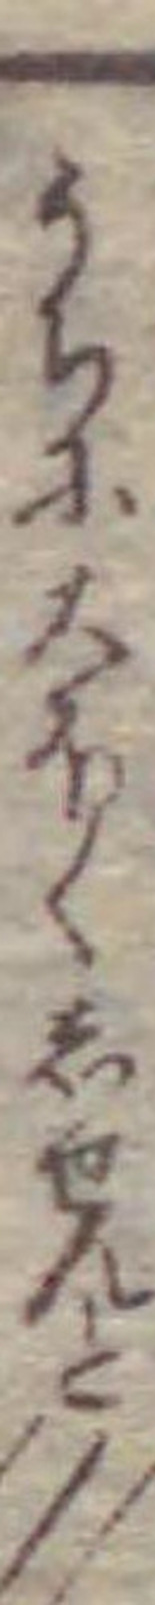うちに大ほくしせんと
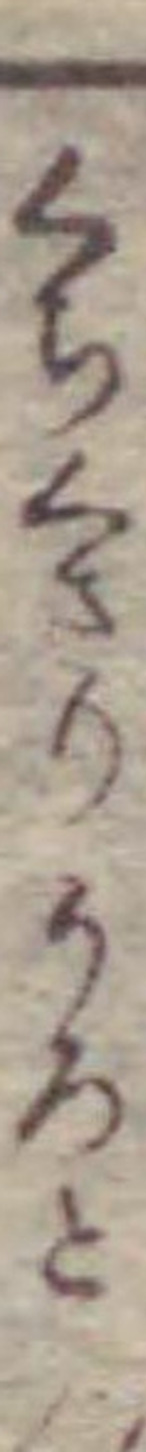くちくさりうろと
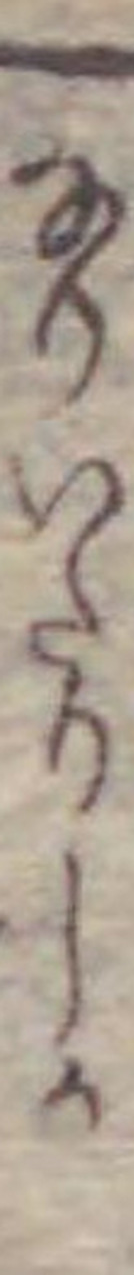なりいたりしか
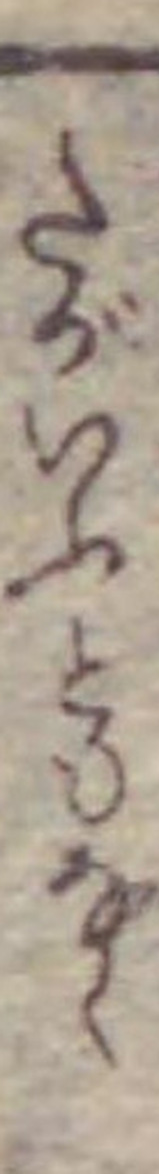たがいふともなく
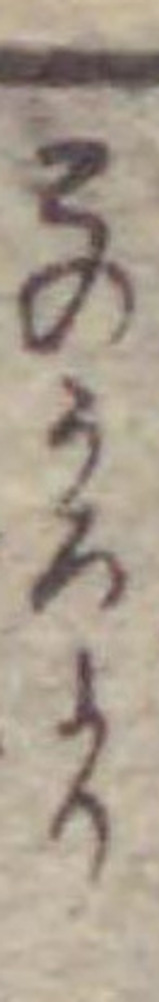このうろより
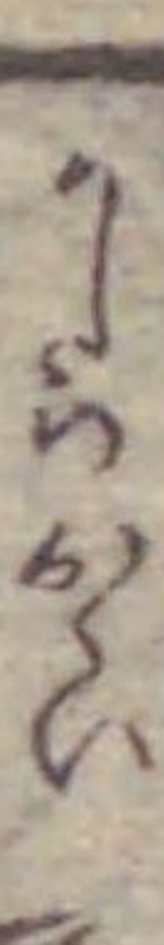かしらおゝい
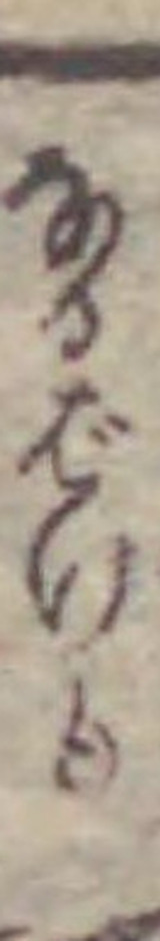なるばけも
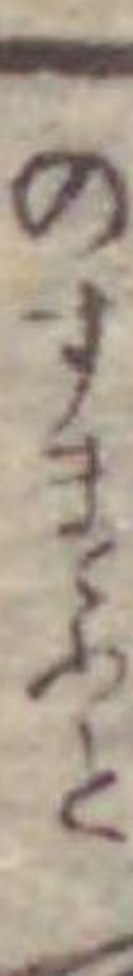のすまふと
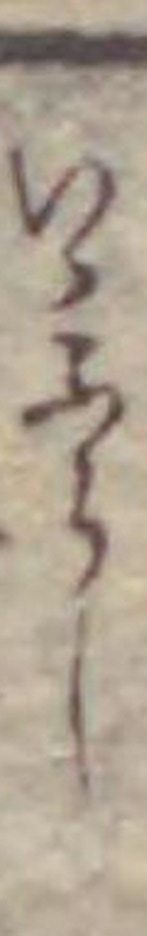いゝふらし
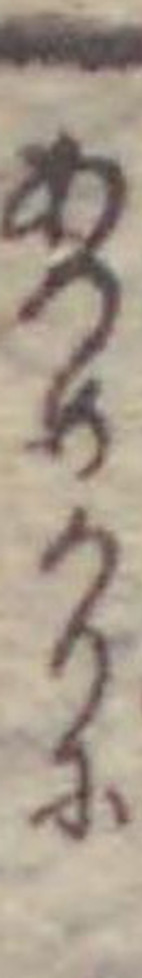あつめかりに
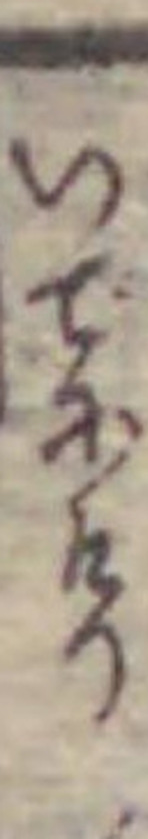いでにけり
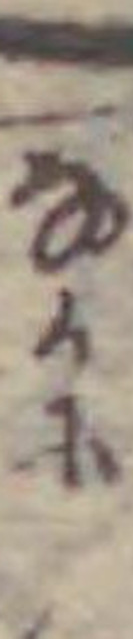〽なかに
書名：武家物奇談 : 3巻
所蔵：国立国会図書館 National Diet Library, JAPAN
